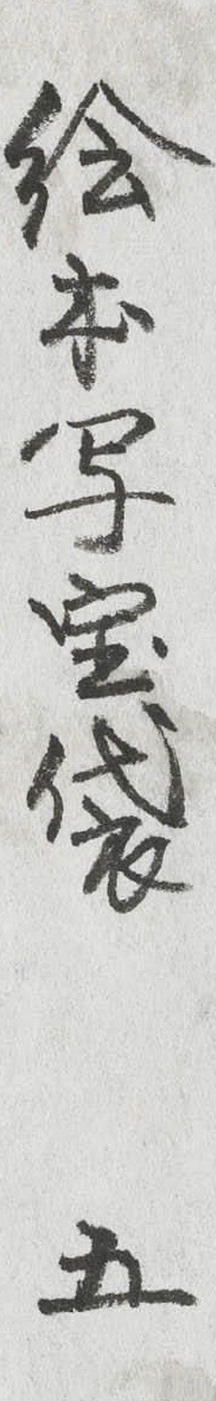絵本写宝袋五
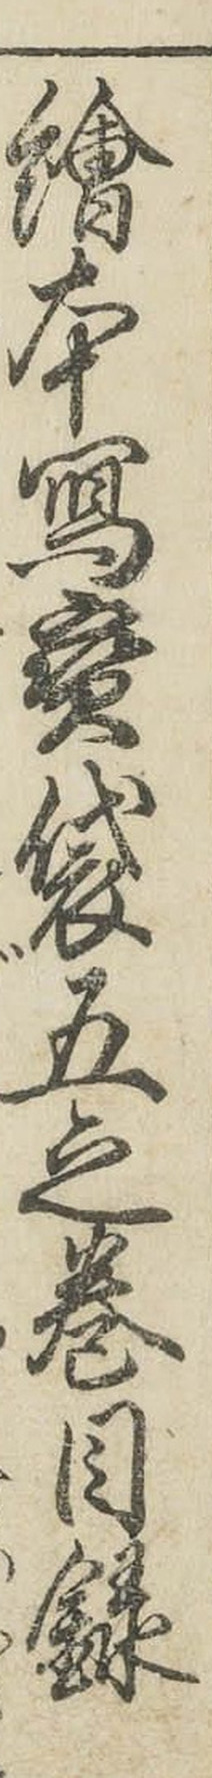絵本写宝袋五之巻目録
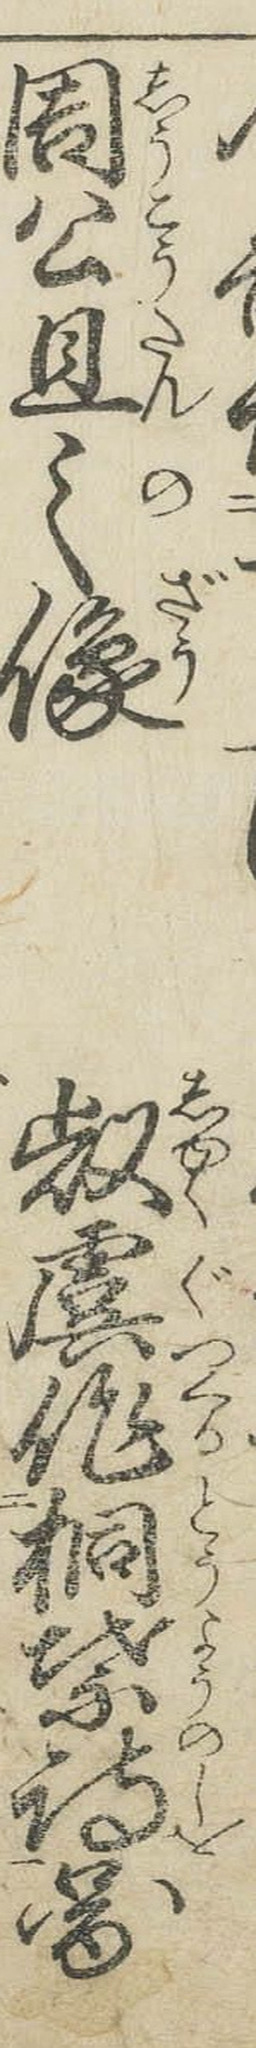周公旦之像叔虞作桐葉詩図
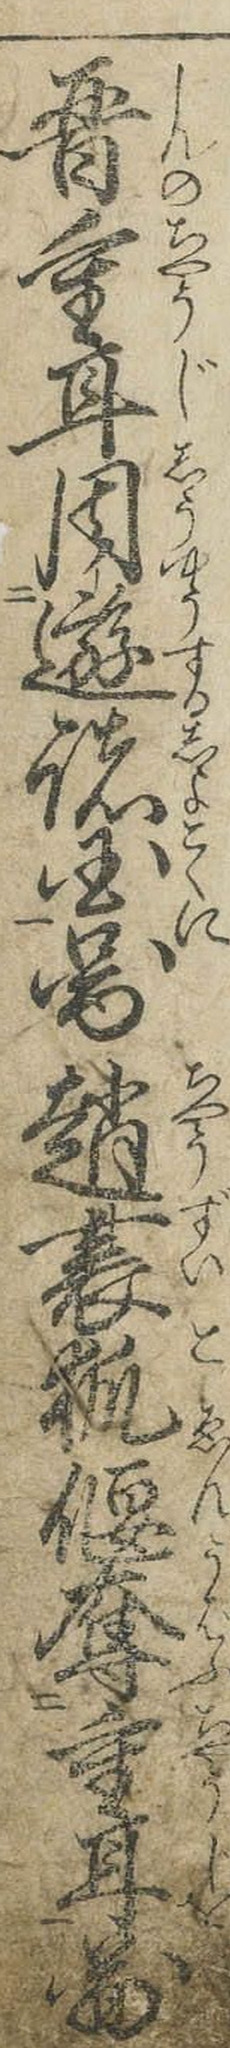晋重耳周-遊諸国図趙衰狐偃奪重耳図

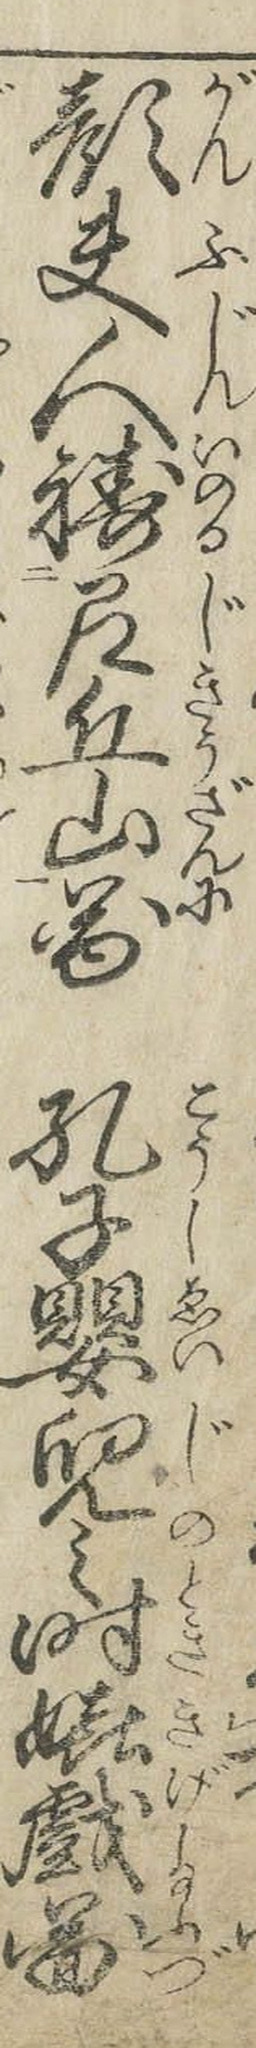顔夫人祷尼丘山図孔子嬰児之時嬉戯図
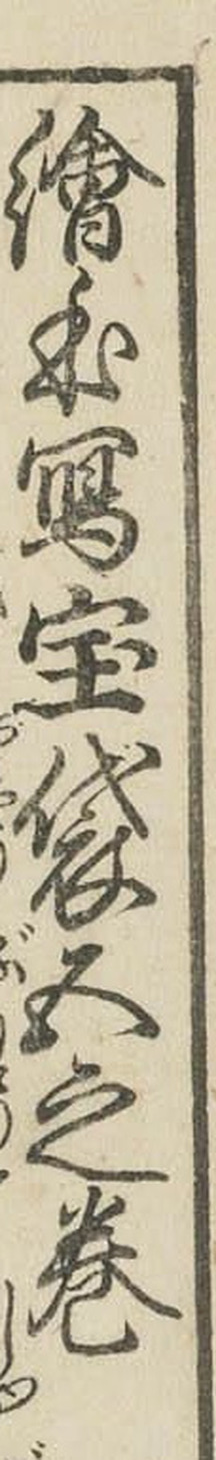絵本写宝袋五之巻
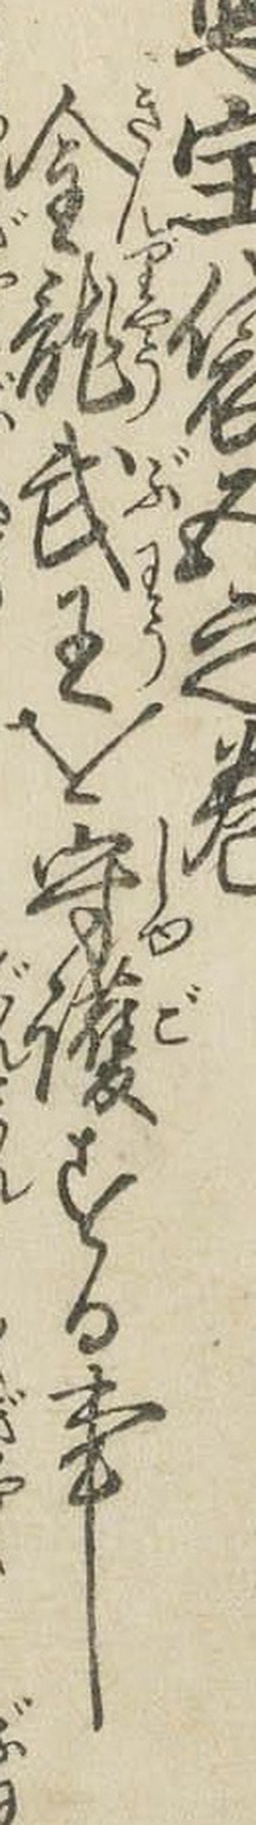金竜武王を守護する事
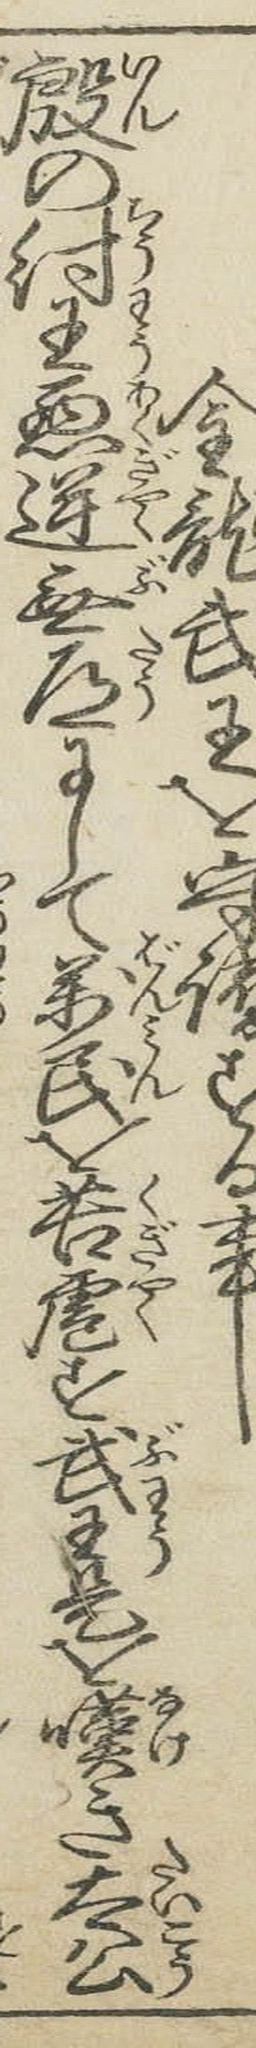殷の紂王悪逆無道にして万民を苦虐す武王是を嘆き太公
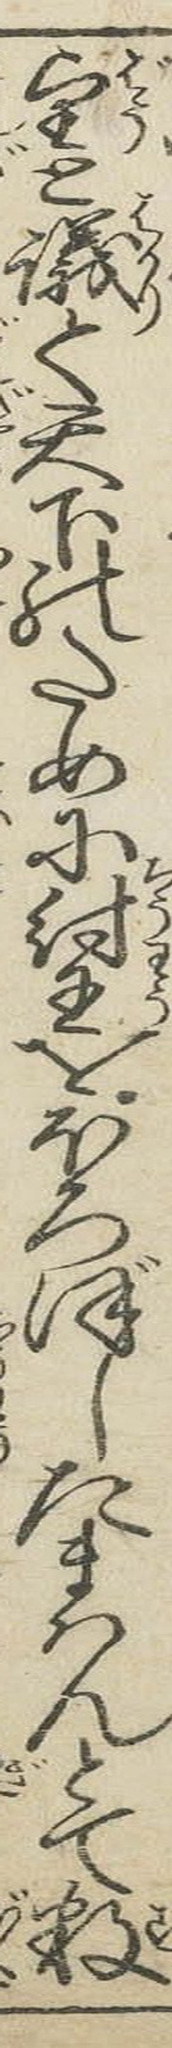望と儀て天下のために紂王を。ほろぼしたまはんとて数
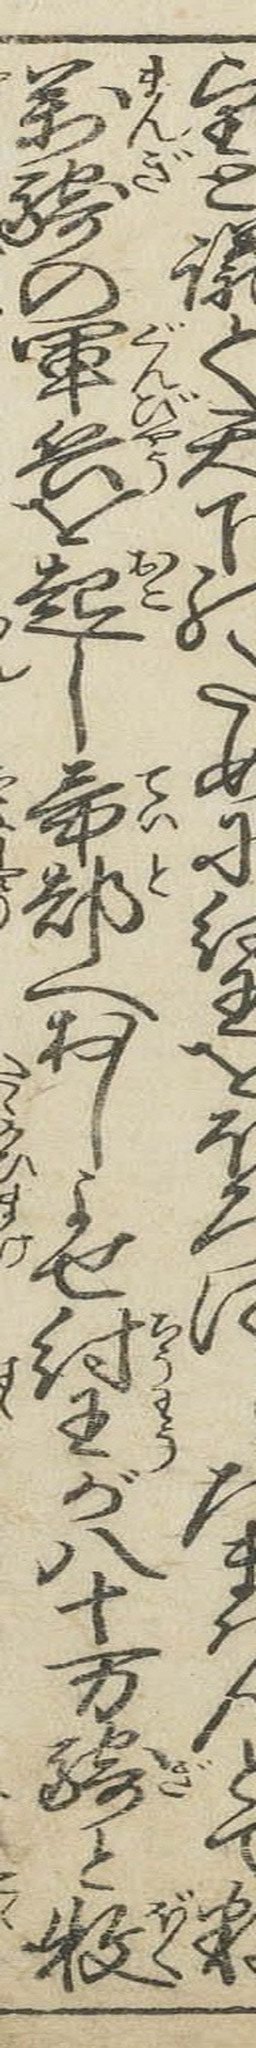万騎の軍兵を起し帝都へおしよせ紂王が八十万騎と牧
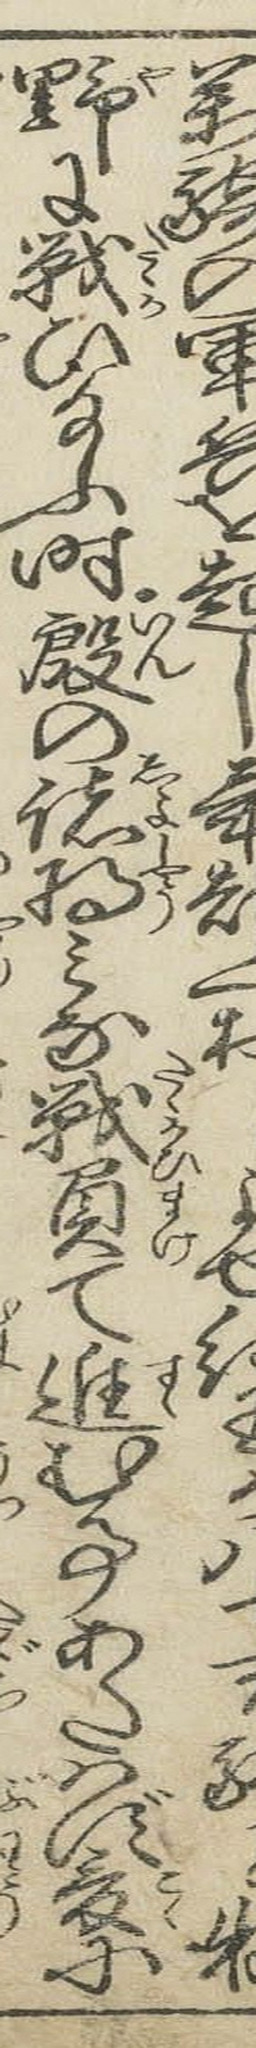野に戦ひ給ふ時。殷の諸将みな戦負て進む事あたはず爰に
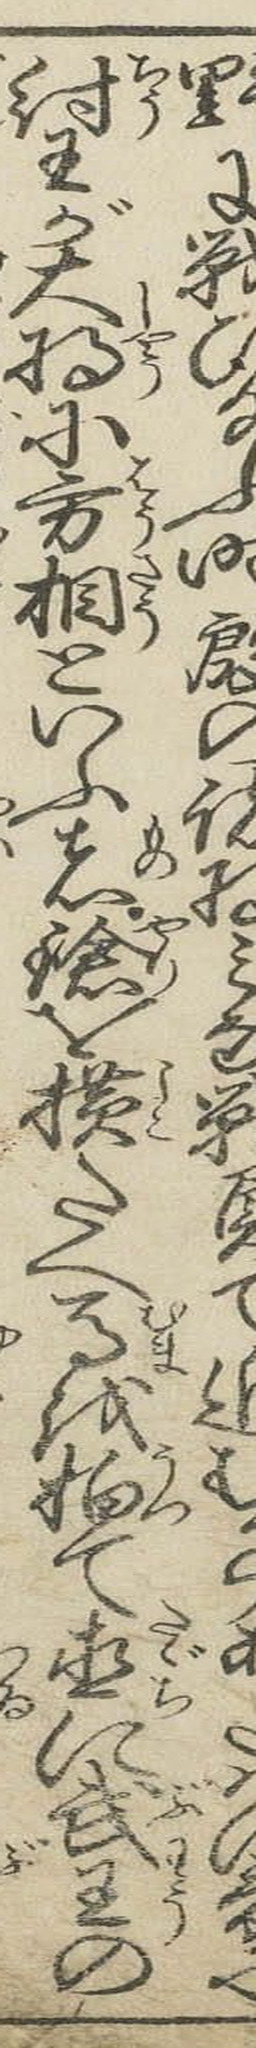紂王が大将に方相といふ者。鎗を横たへ馬を拍て直に武王の
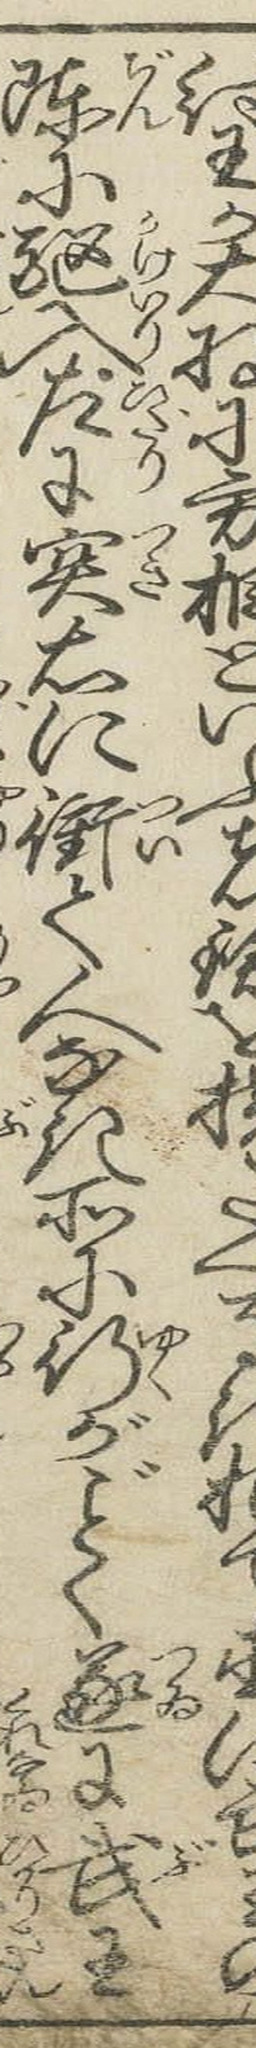陣に駆入。左に突右に衝て人なき所に行がごとく遂に武王
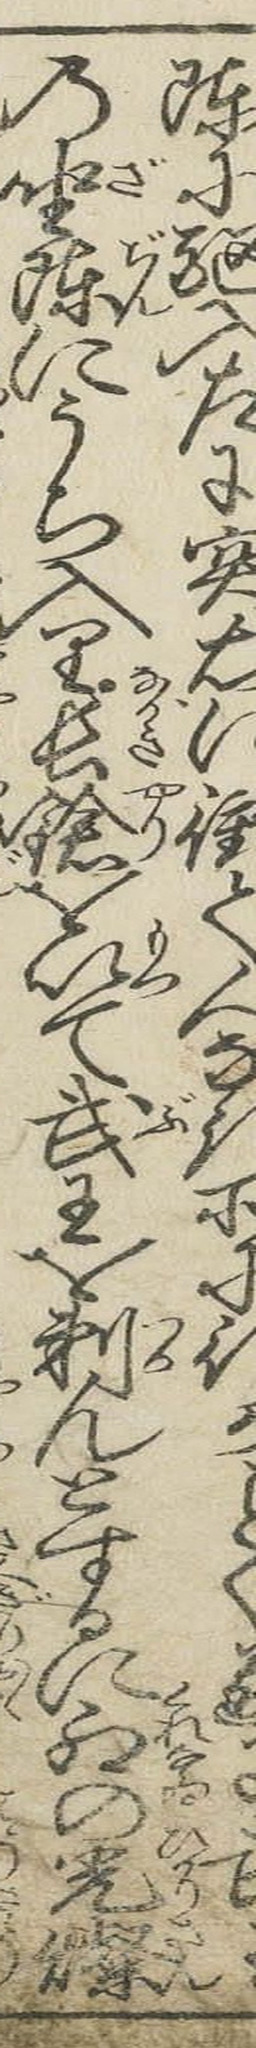の坐陣にうち入り。長槍を以て武王を刺んとするに紅の光燦
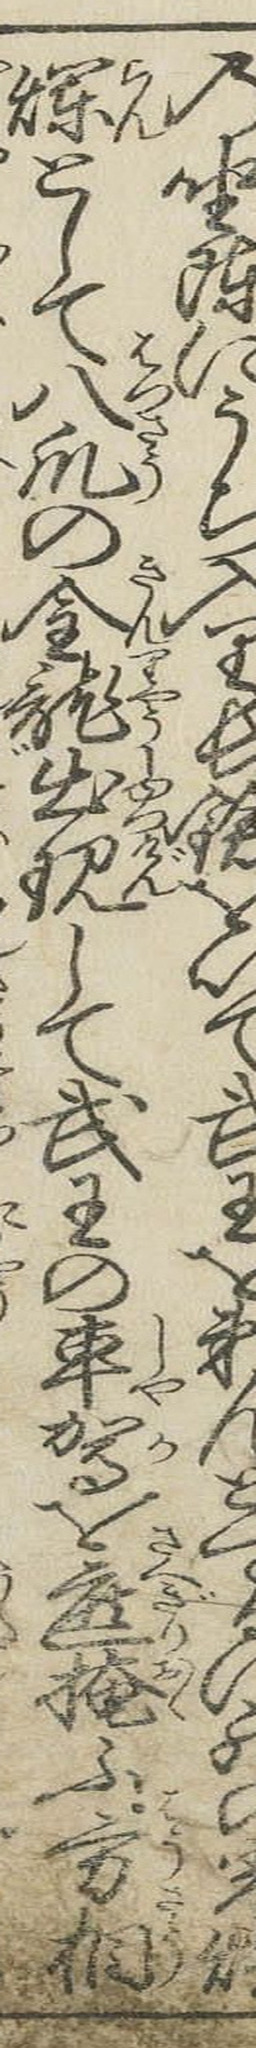爛として八爪の金竜出現して武王の車駕を遮掩ふ。方相
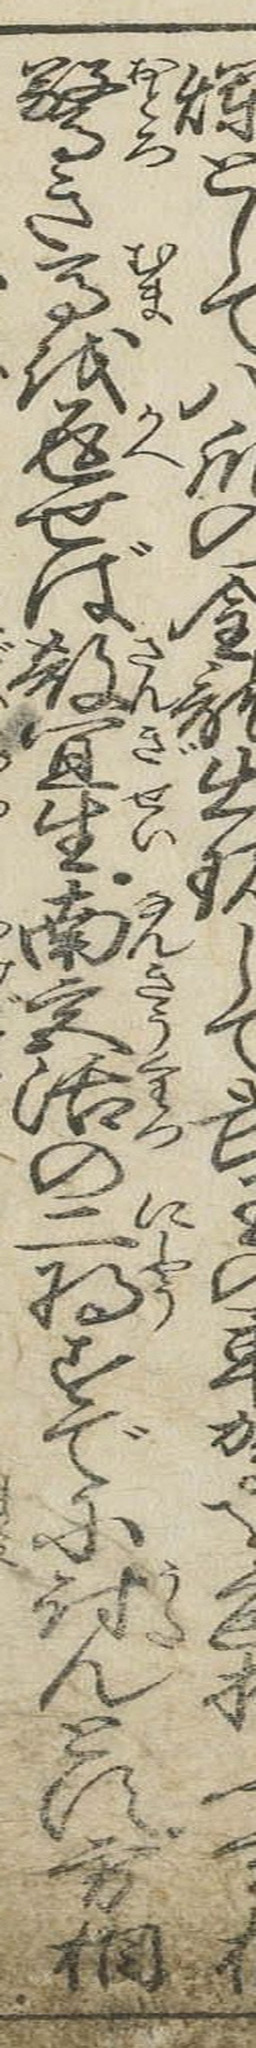驚き馬を返せば散宜生。南宮活の二将すでに討んとす。方相
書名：絵本写宝袋 9巻 5之巻
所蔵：東京学芸大学教育コンテンツアーカイブ
